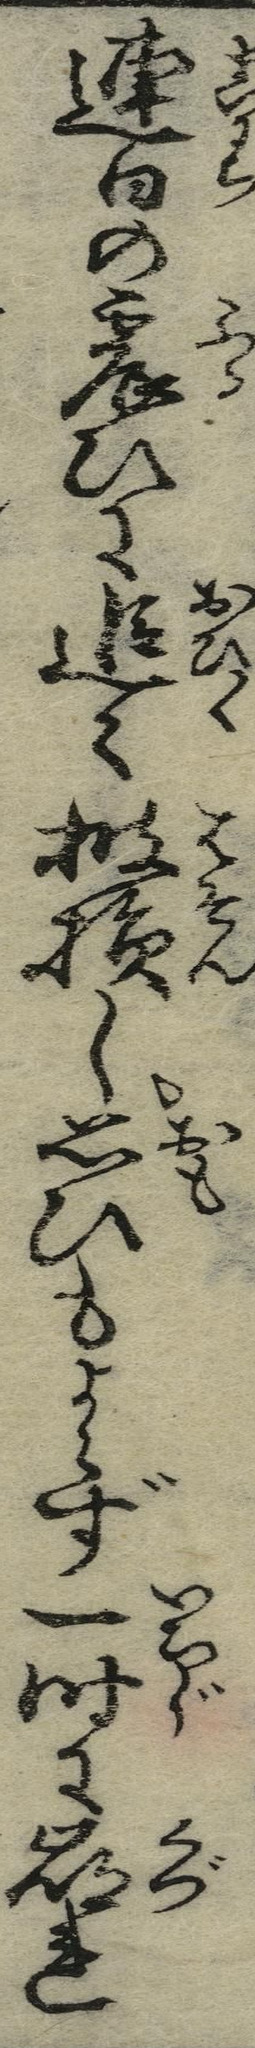連日の震ひに追々柀損し。思ひもよらず一時に崩れ
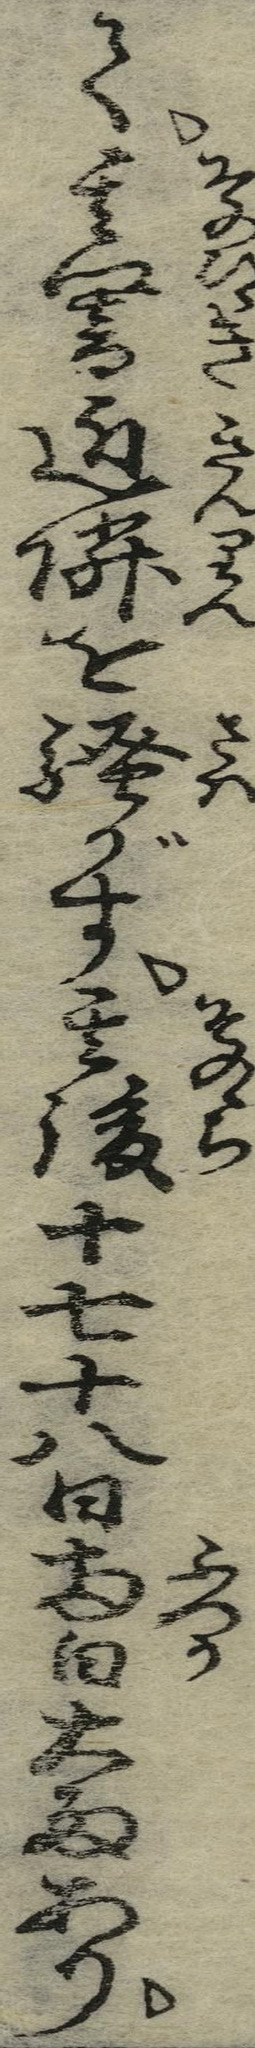て。其響近隣を騒がす。其後十七十八日両日大雨あり。
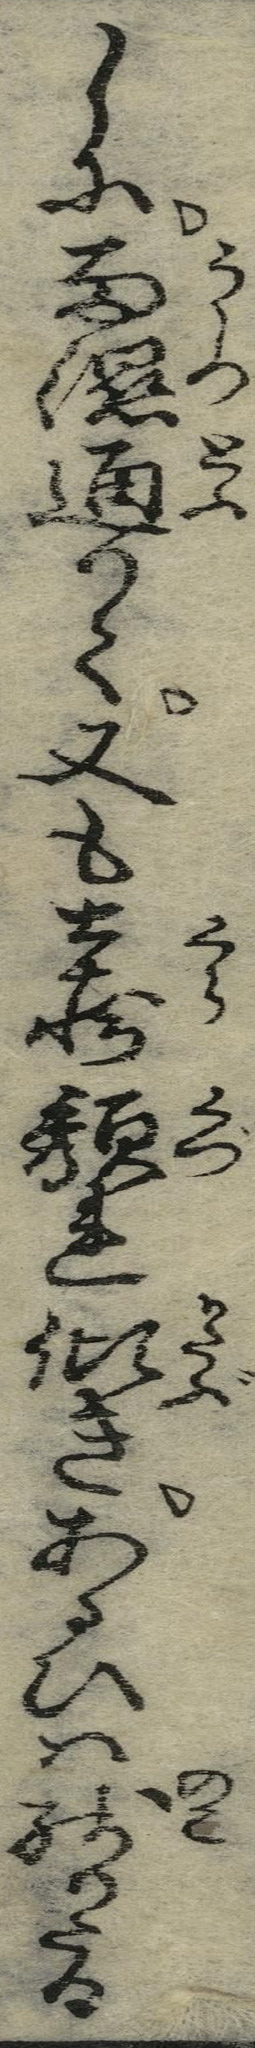しに。雨湿通りて。又も土蔵頽れ傾き。あるひは残りたる

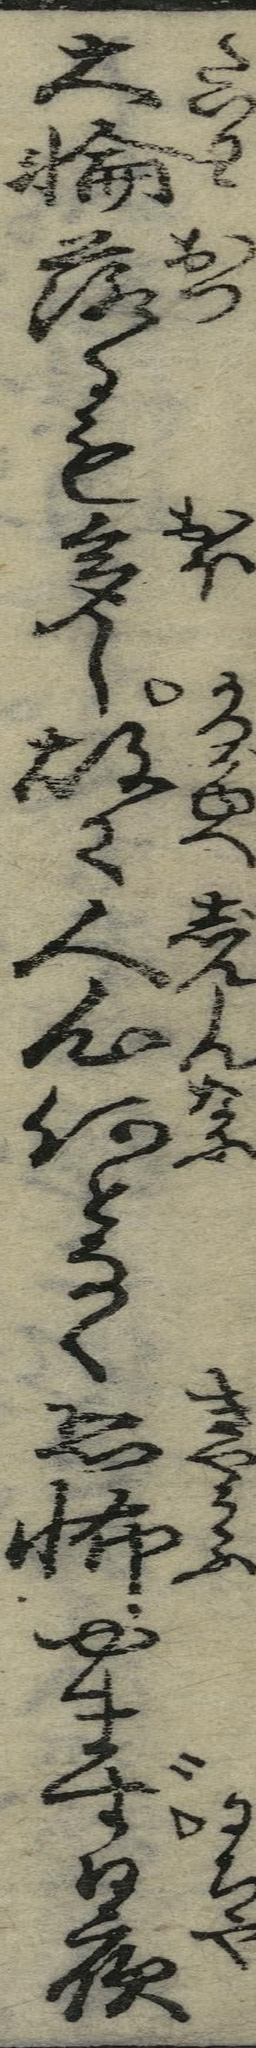大輪落るも多し。故に人心何となく恐怖やまず。日夜
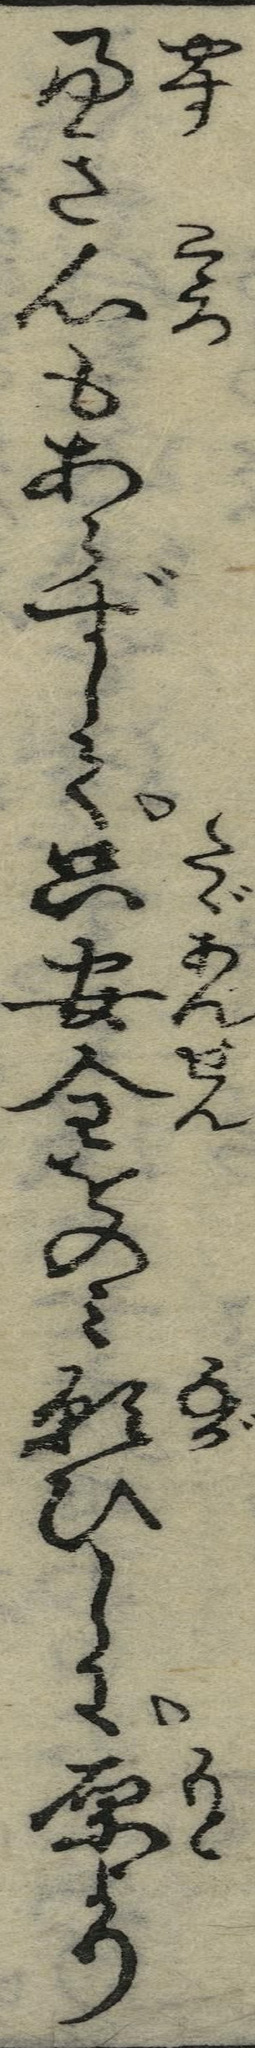易き心もあらずして。只安全をのみ願ひしに。原より
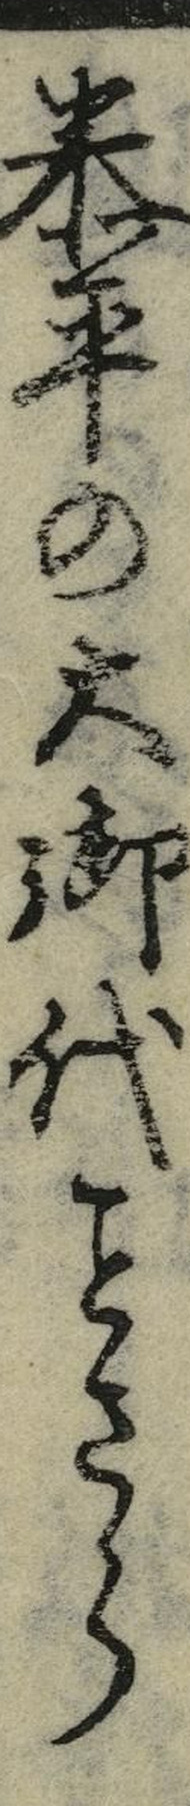泰平の大御代ことさら
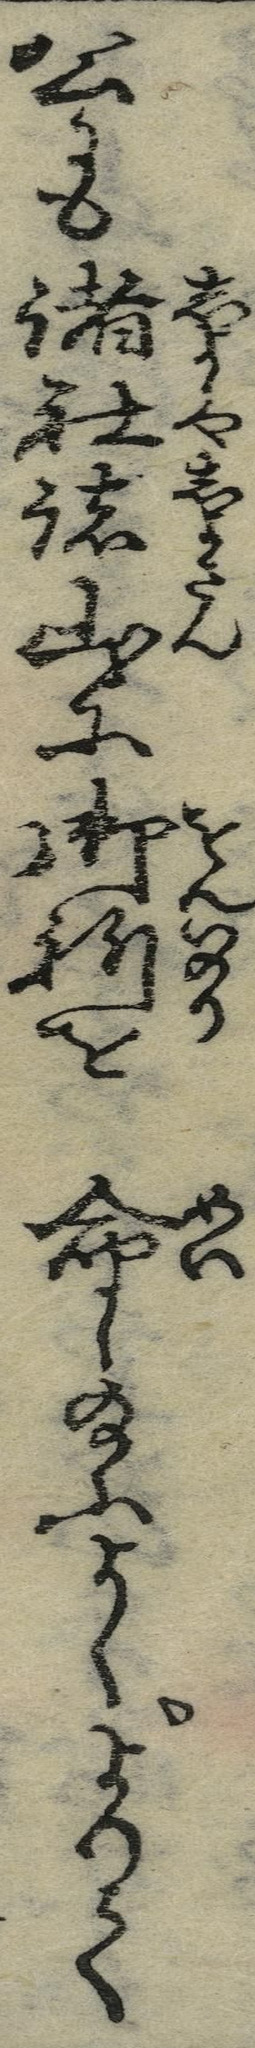公にも諸社諸山に御祈を命し給ふよし。よりて
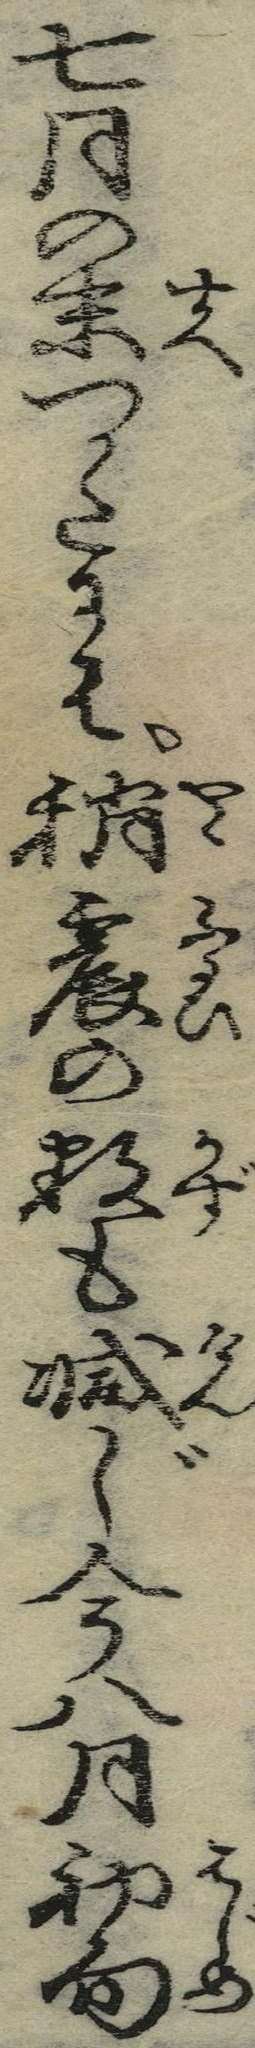七月の末つかたには。稍震の数も減じ今八月初旬
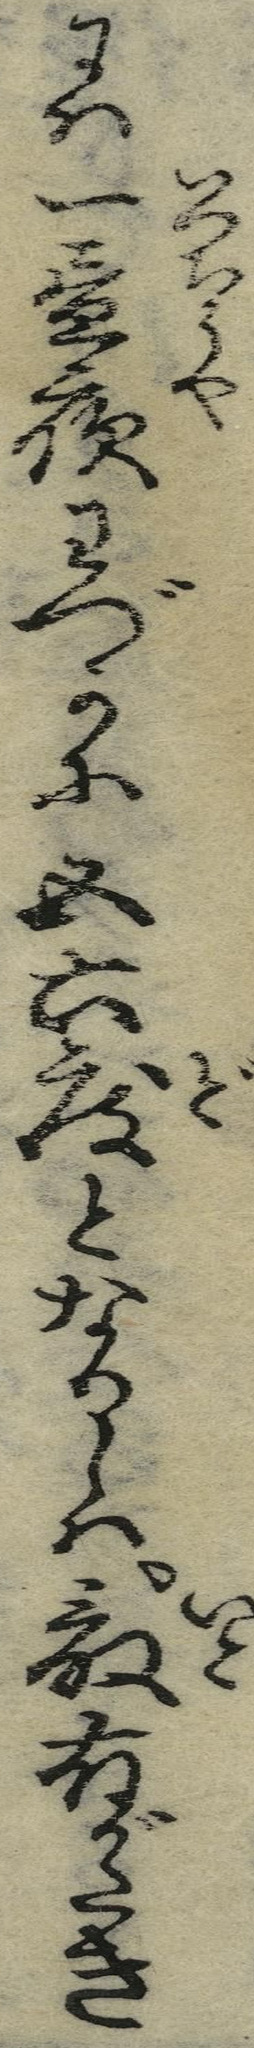には一昼夜わづかに五六度となりしは。最有がたき
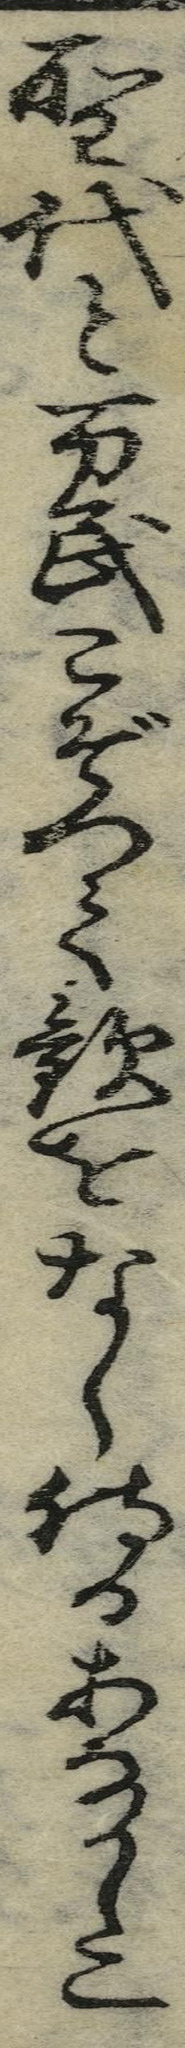聖代と万民こぞつて歓をなし侍るあなかしこ
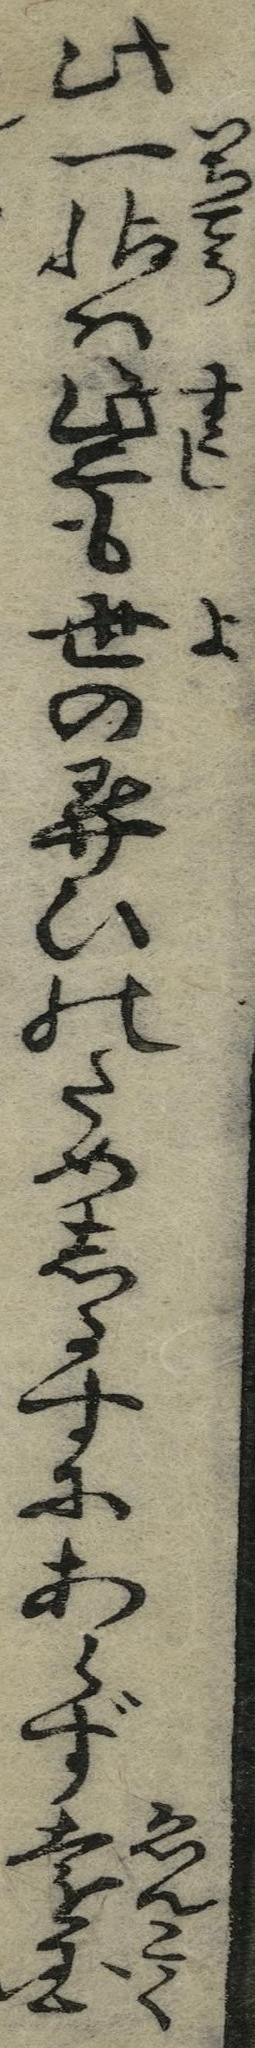此一帖は些も世の弄ひのためしるすにあらず遠国
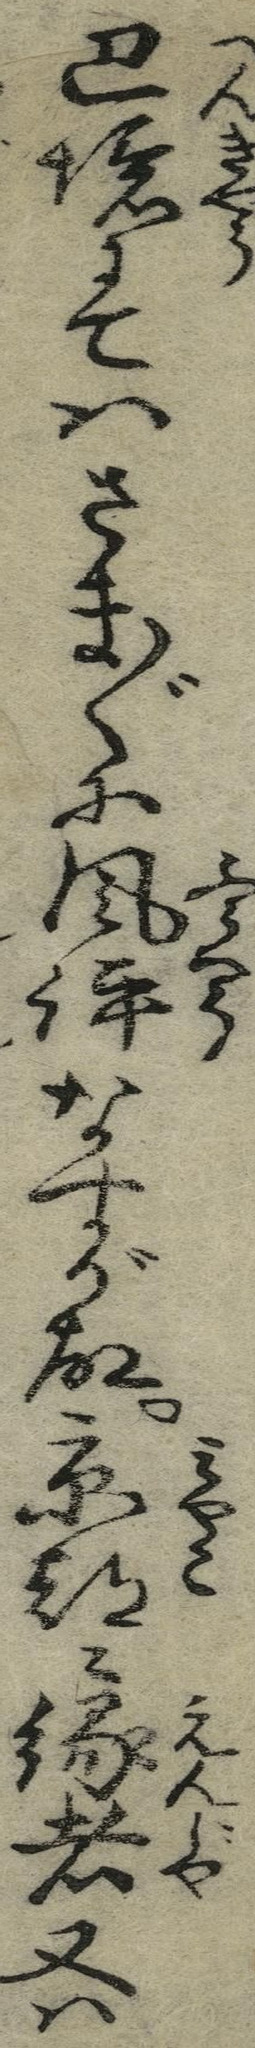辺境にてはさま〴〵に風評なすが故。京都に縁者又は
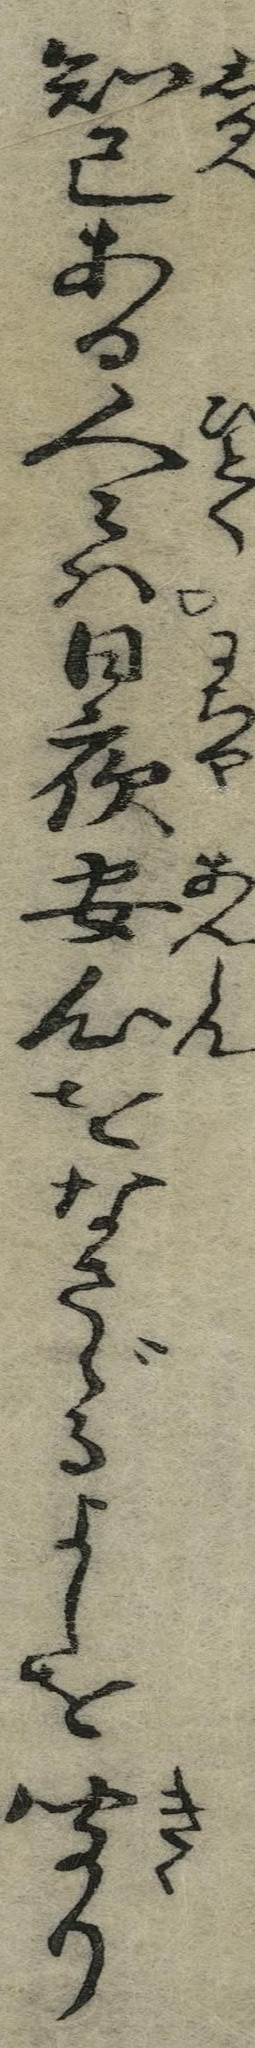知己ある人々は。日夜安心をなさゞるよしを聞り
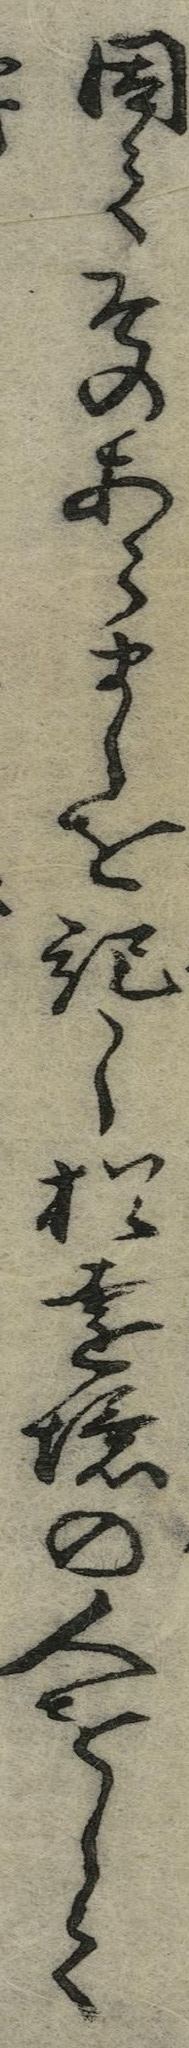因てそのあらましを記し猶遠境の人をして
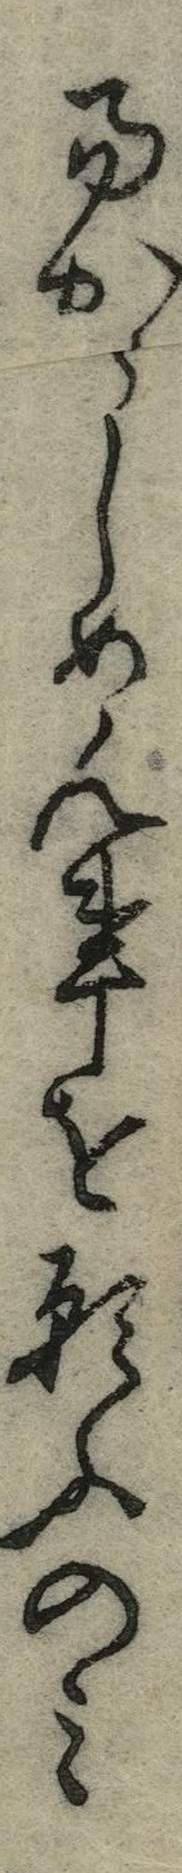易からしめん事を願ふのみ
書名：本朝地震記　全
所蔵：東京大学地震研究所図書室 Earthquake Research Institute Library, The University of Tokyo, JAPAN
